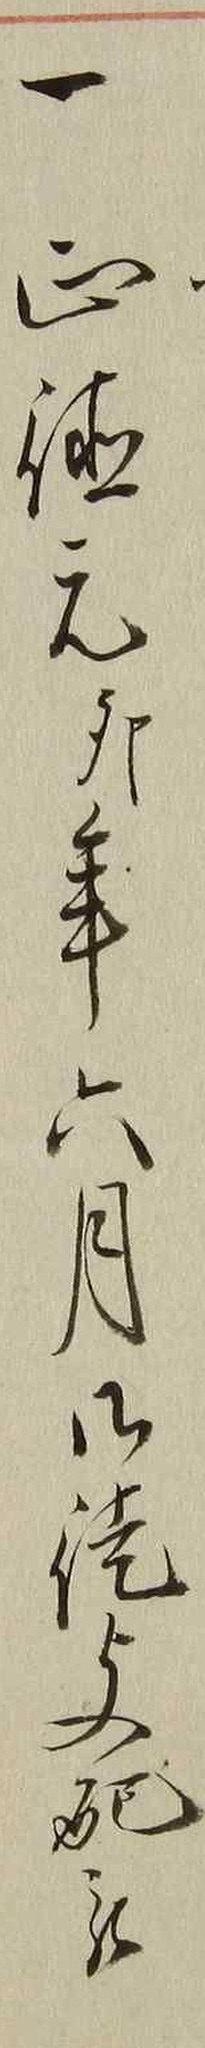一正徳元卯年六月御徒支配被
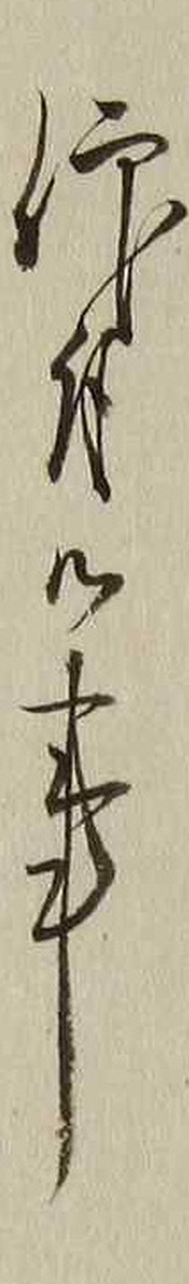仰付候事
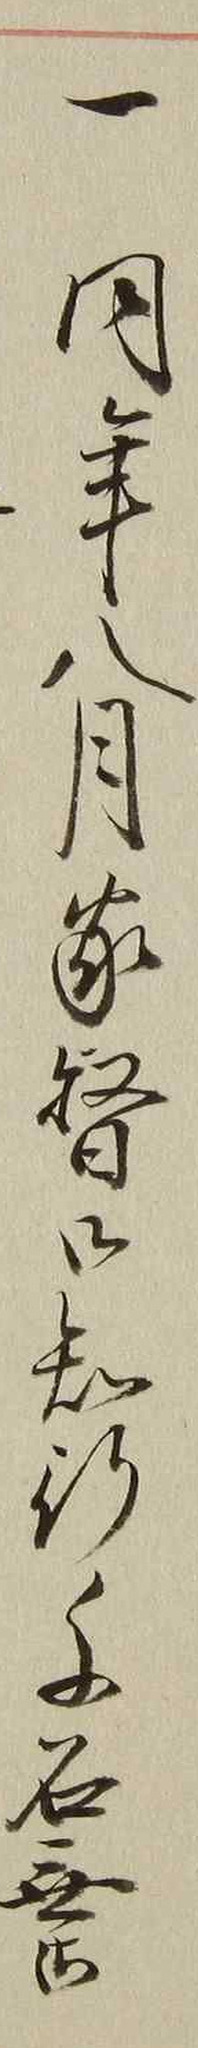一同年八月家督御知行千石無御
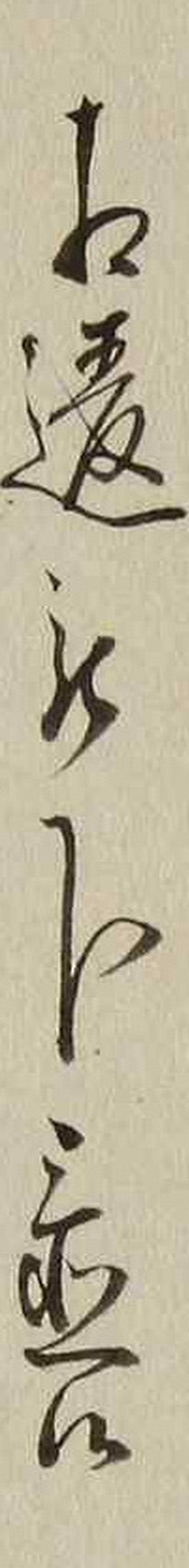相違被下置候
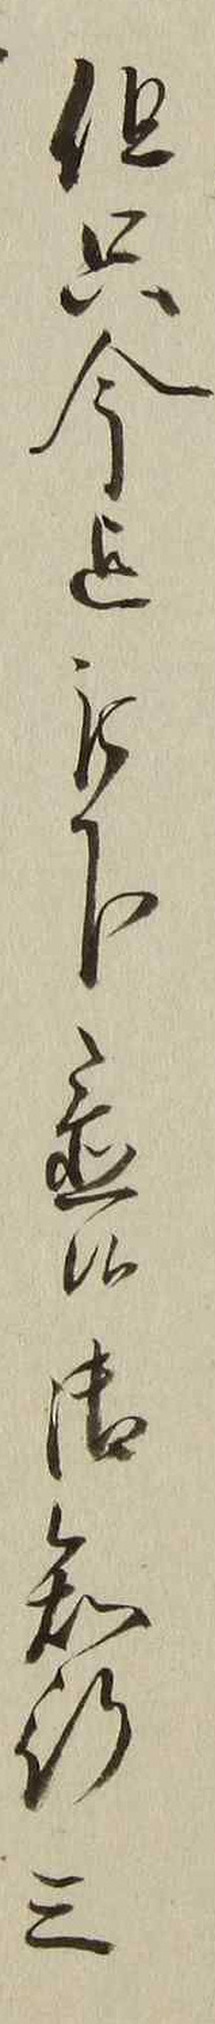但只今迄被下置候御知行三
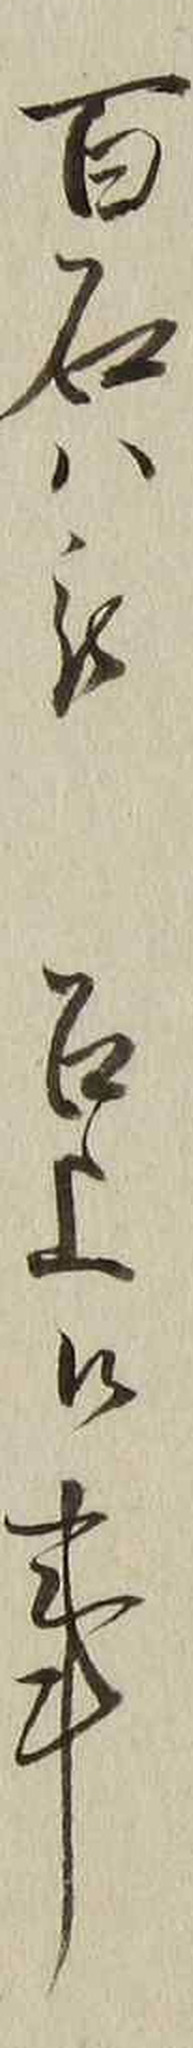百石は被召上候事
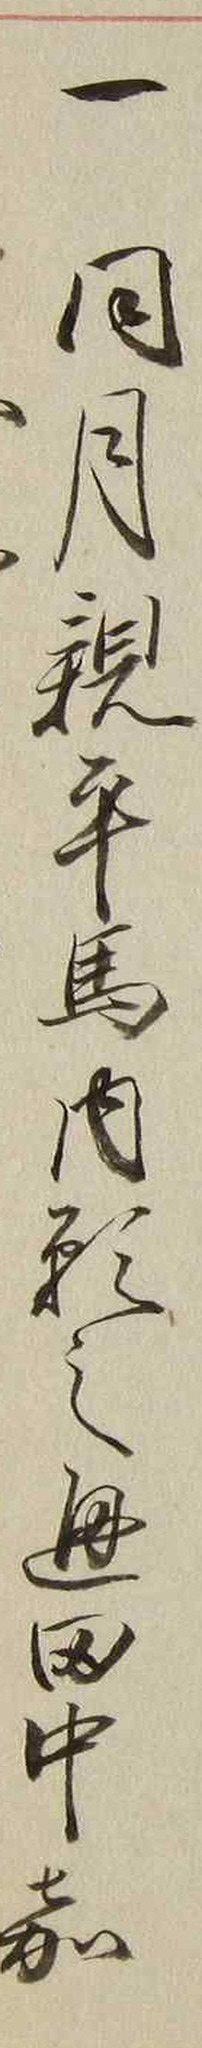一同月親平馬内願之通田中嘉
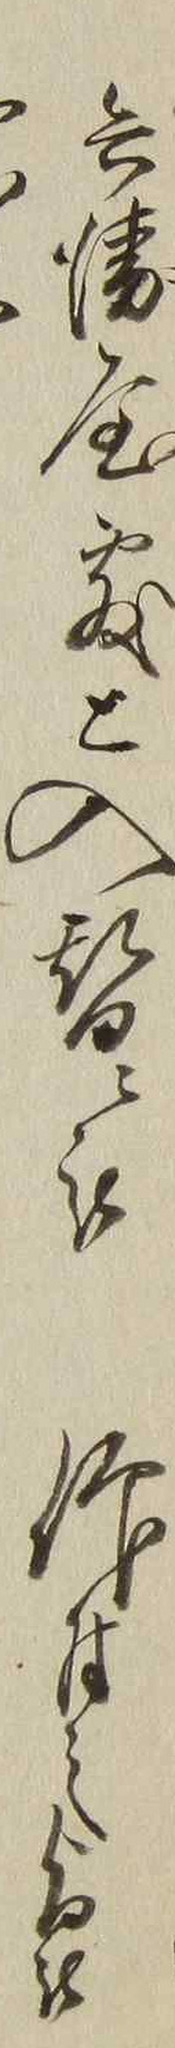兵衛屋敷と入替に被仰付之旨被
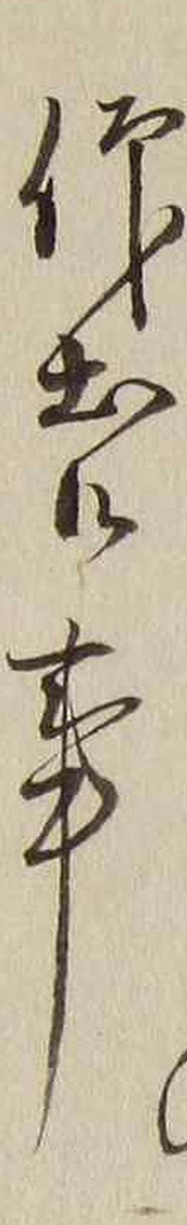仰出候事
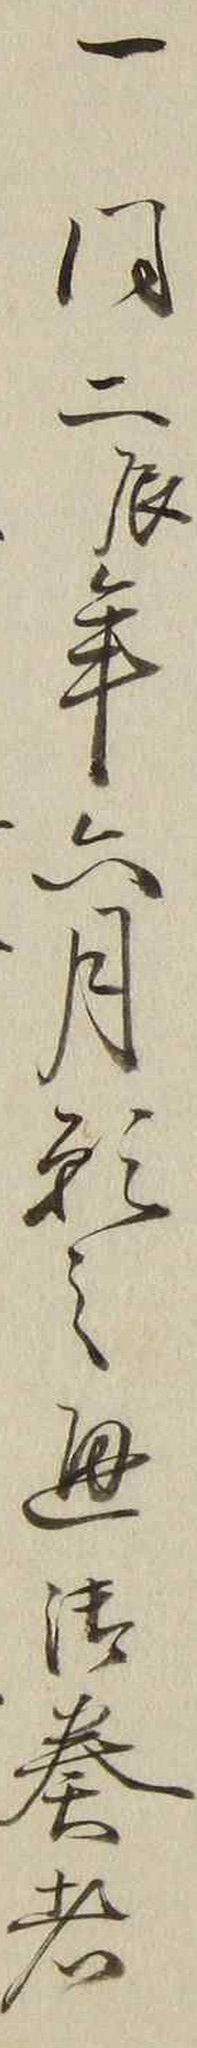一同二辰年六月願之通御奏者
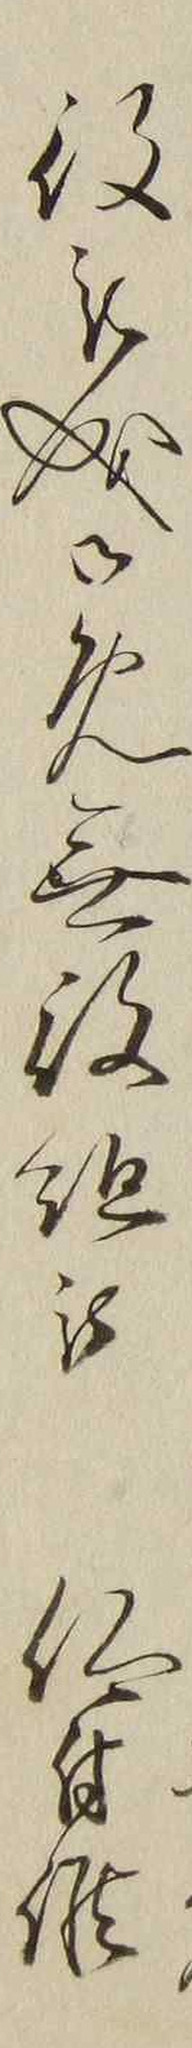役被成御免無役組被仰付候

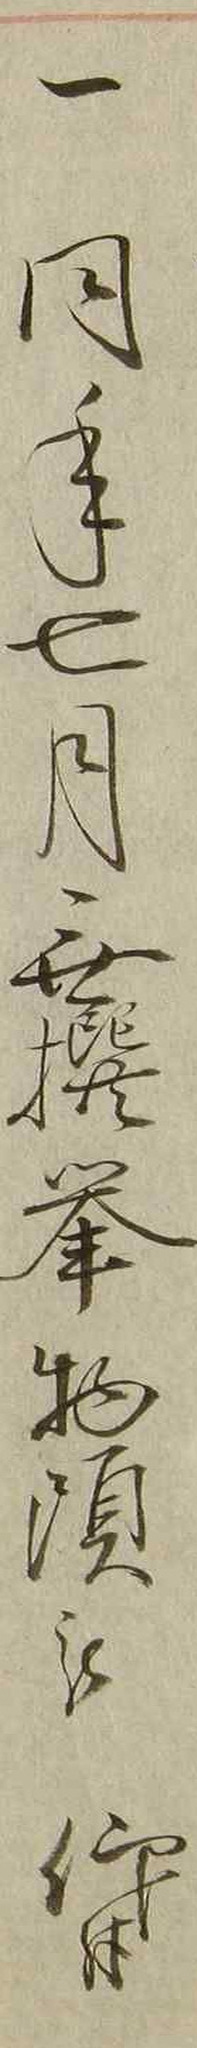一同年七月無撰挙物頭被仰付
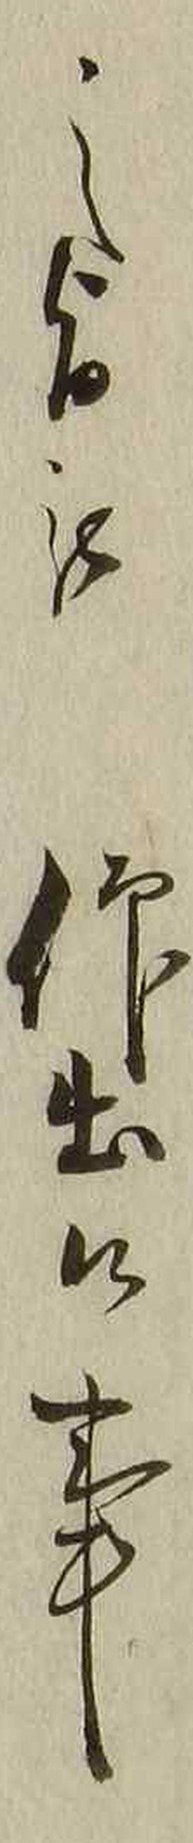之旨被仰出候事
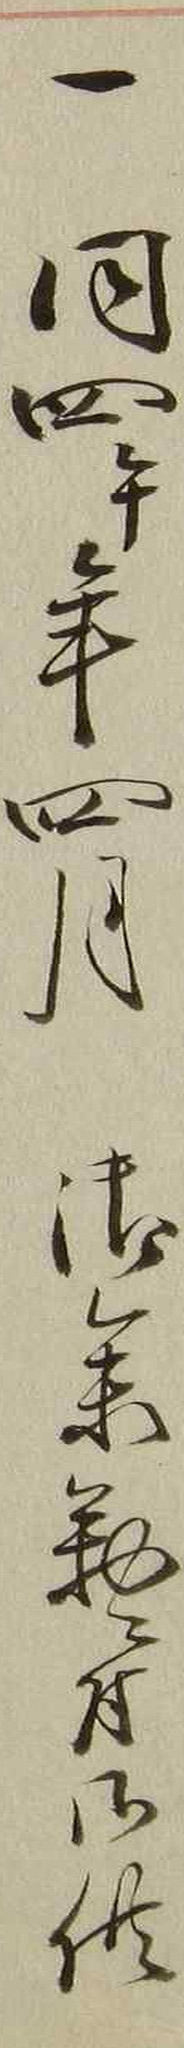一同四午年四月御参勤に付御供
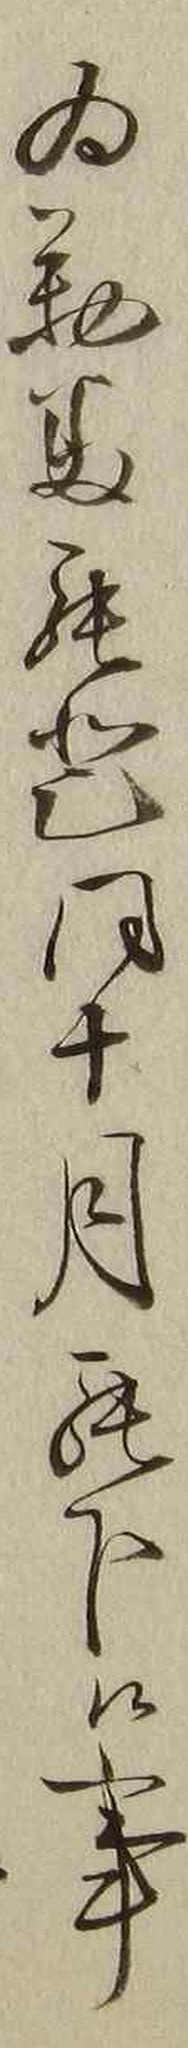為勤番罷登同十月罷下候事
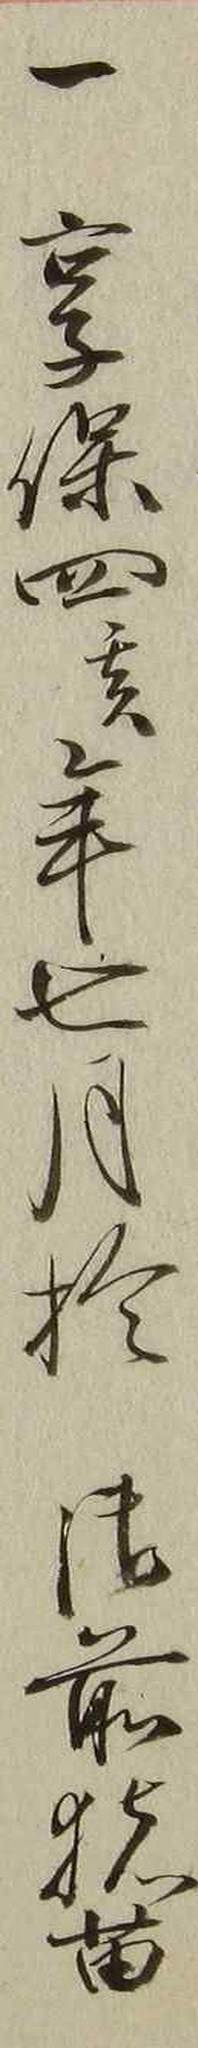一享保四亥年七月於御前猪苗
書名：諸士系譜　巻之103　か之部11
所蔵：会津若松市立会津図書館
